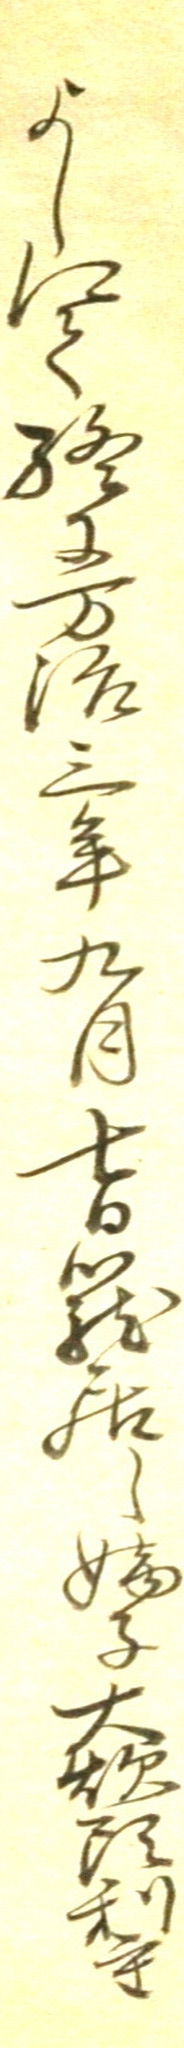よしにて終に万治三年九月七日籠居し嫡子大炊頭利重
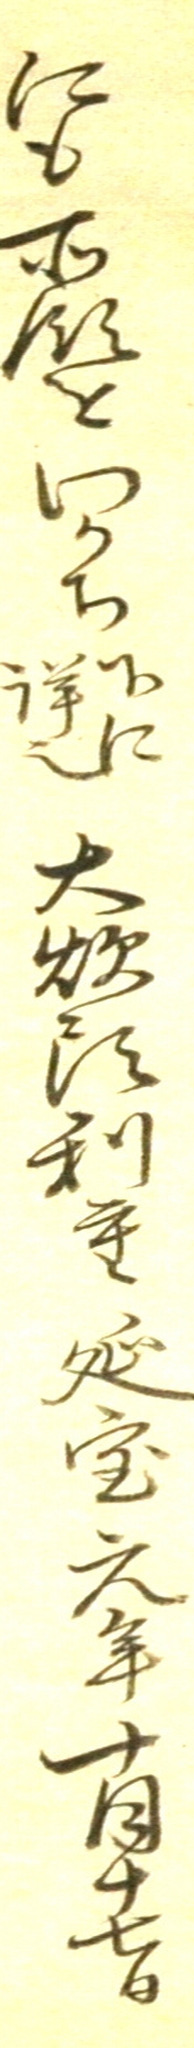にも所領をわかち下に詳也大炊頭利重延宝元年十月十七日
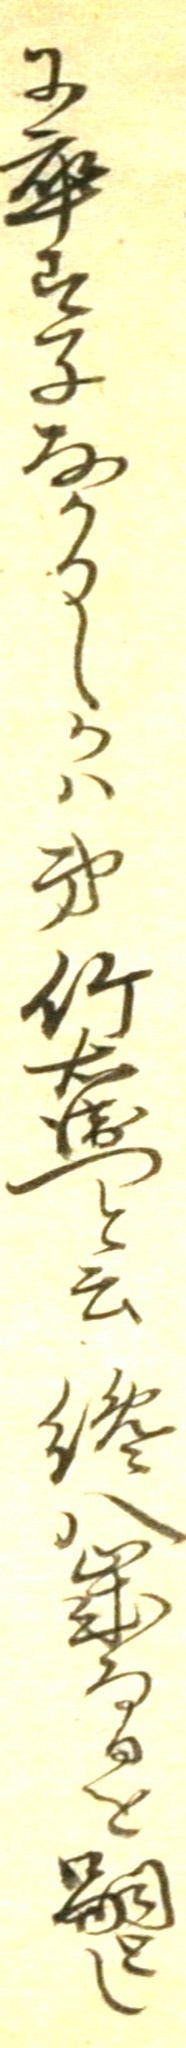に卒す子なかりしかは弟竹右衛門と云纔八歳なるを嗣とし
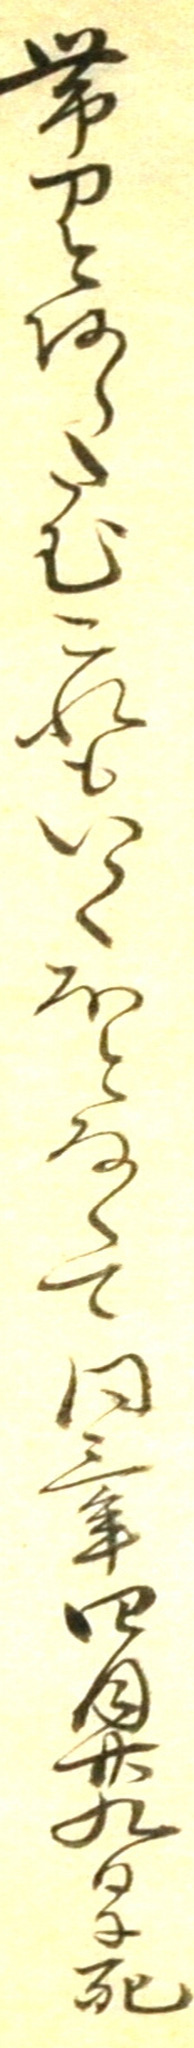帯刀とあらたむこれもいくほとなくて同三年四月廿九日に死
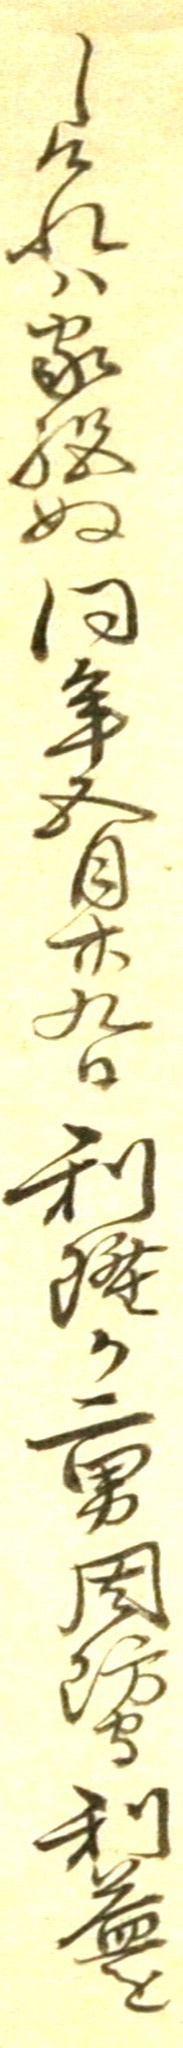しけれは家絶ぬ同年五月廿九日利隆か二男周防守利益を
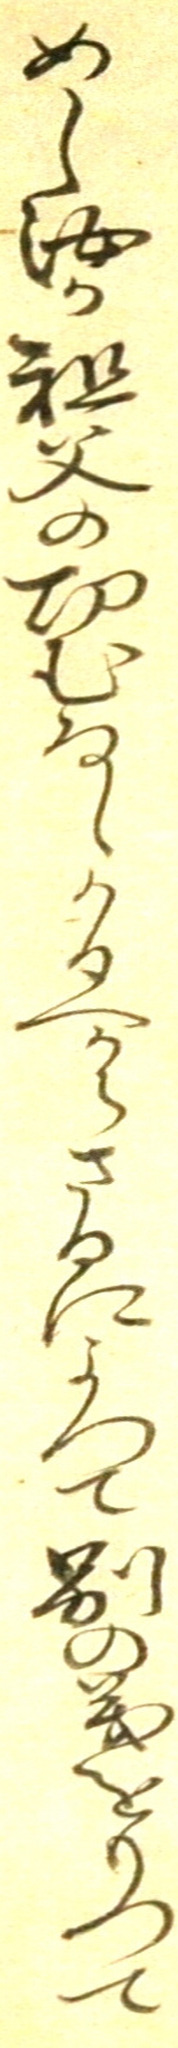めし汝か祖父の功むなしかるへからさるによつて別の義をもつて
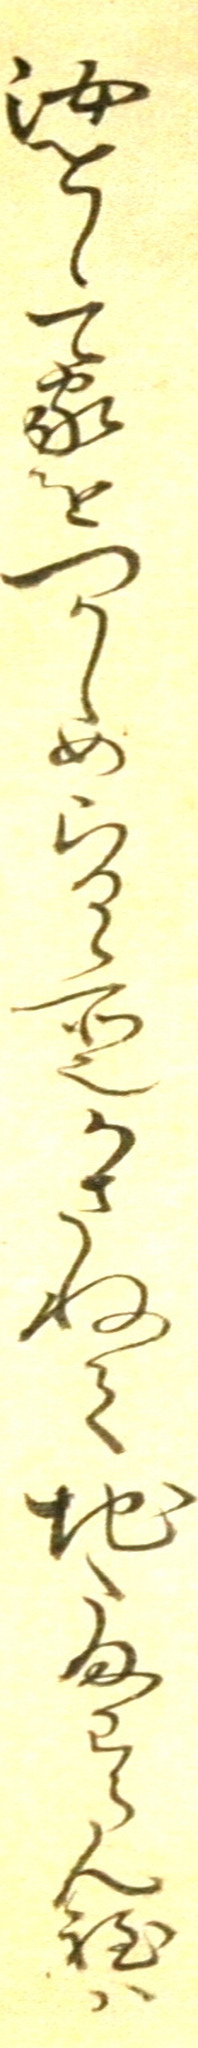汝をして家をつかしめらるゝ所也かさねて地たまわらん程は

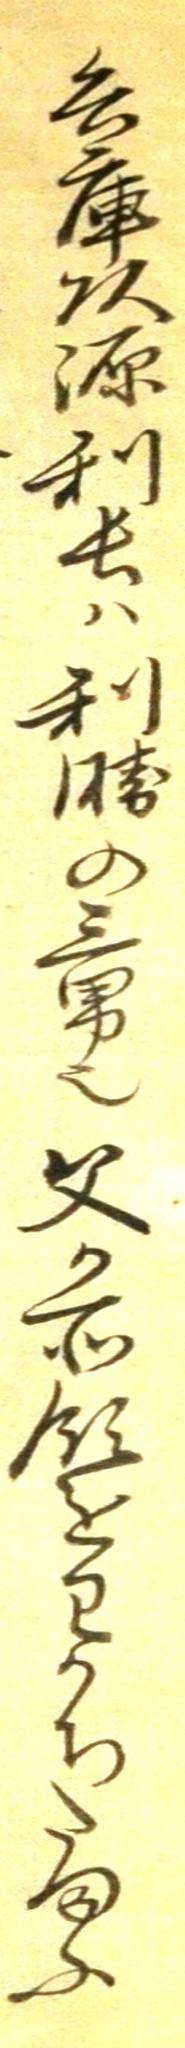兵庫頭源利長は利勝の三男也父か所領をわかちたまふ
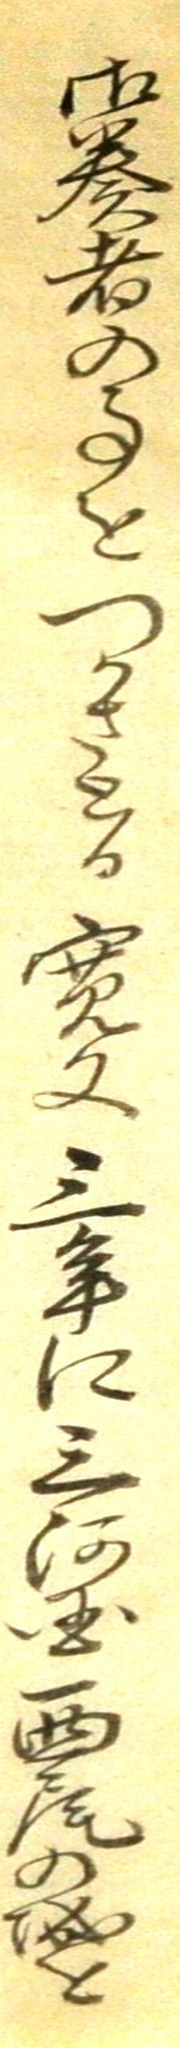御奏者の事をつかさとる寛文三年に三河国西尾の城を
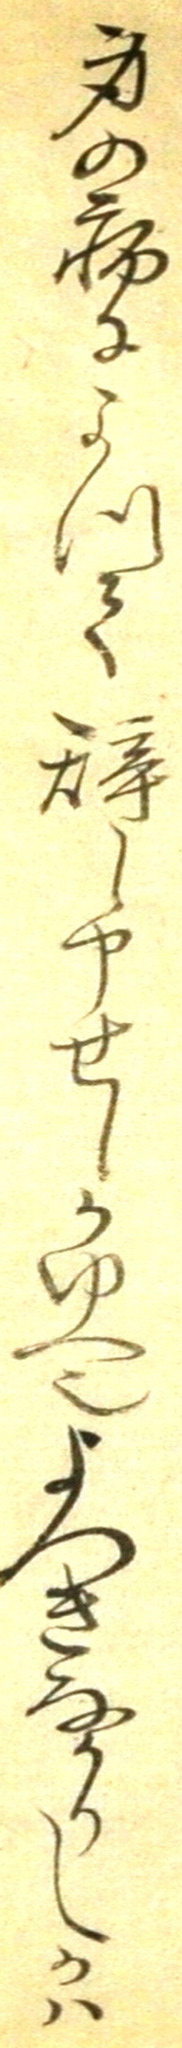身の病によつて辞し申せしかゆへ也よつきなかりしかは
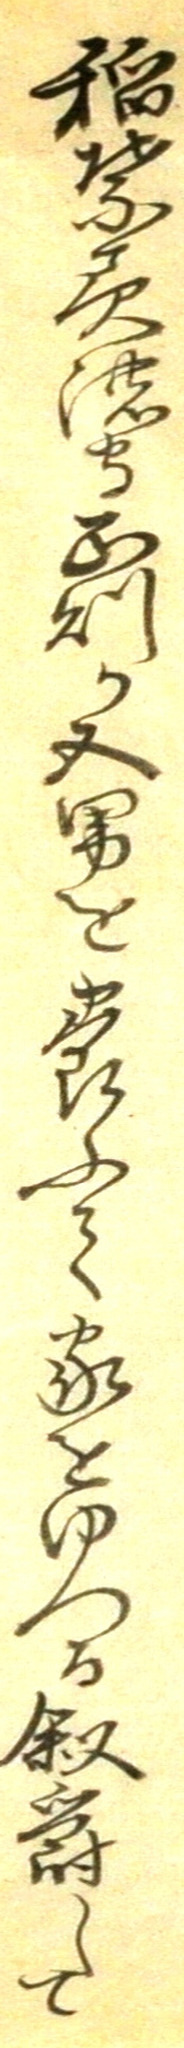稲葉美濃守正則か五男を養ふて家をゆつる叙爵して
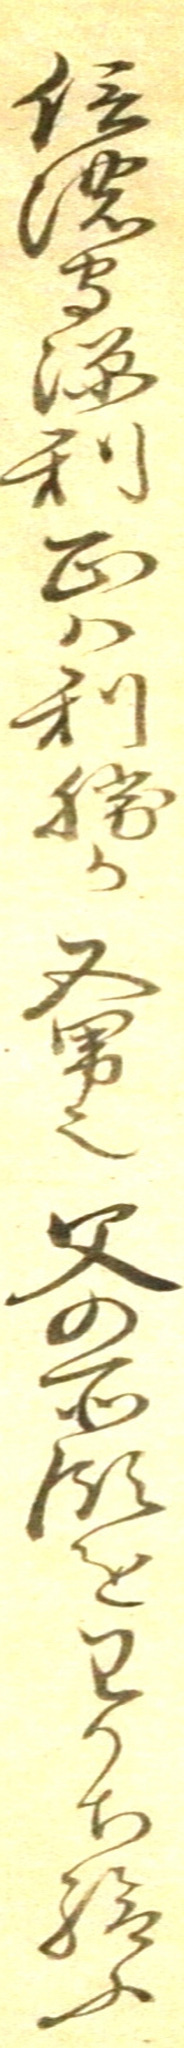信濃守源利正は利勝か五男也父の所領をわかち給ふ
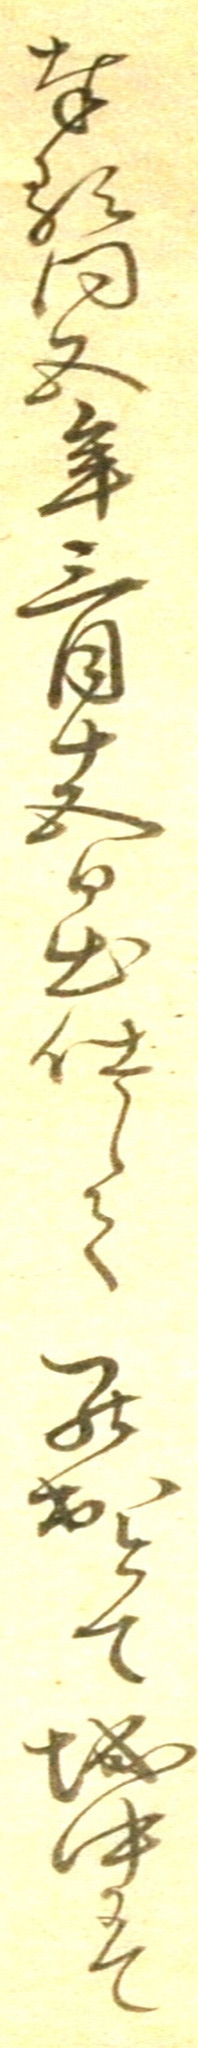奉る同五年三月十五日出仕して罷出とて城中にて
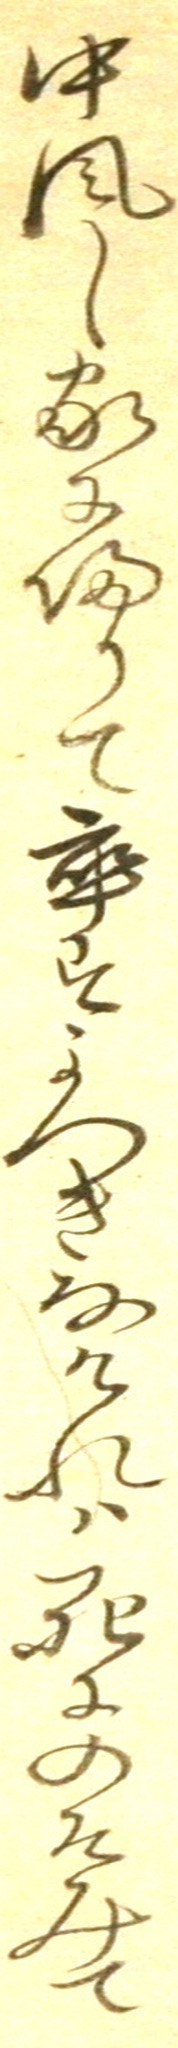中風し家に帰りて卒すよつきなけれは死にのそみて
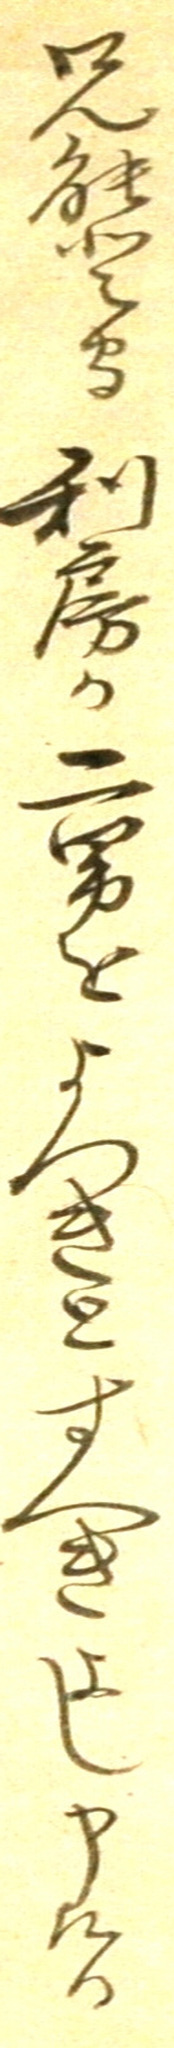兄能登守利房か二男をよつきとすへきよし申ける
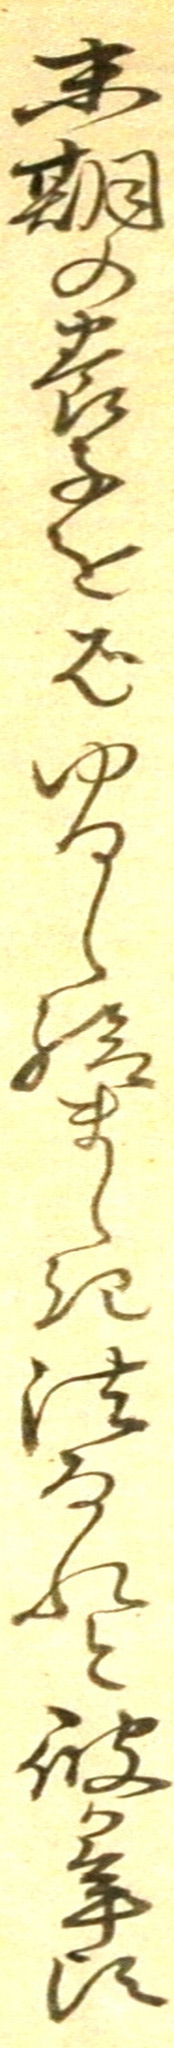末期の養子をばゆるし給ましき法なれと彼か年頃
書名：藩翰譜（五）
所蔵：伊那市立高遠町図書館・合同会社AMANE
